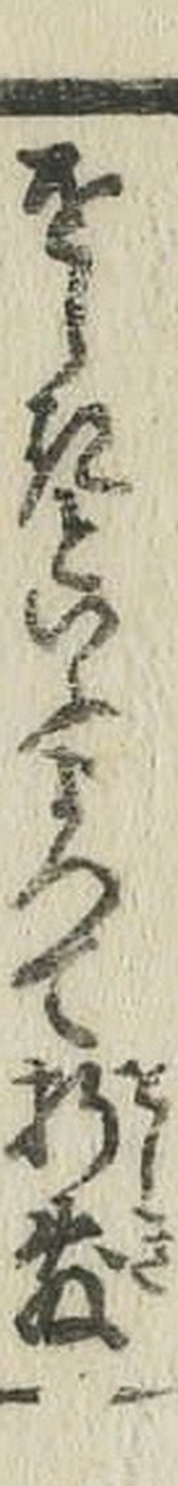をしきといふよつて折敷
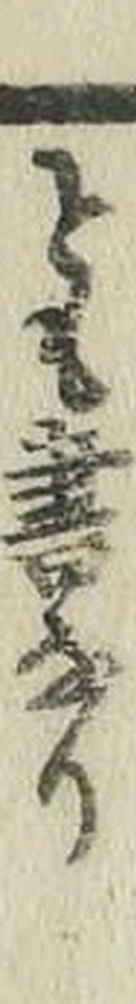とも書なり
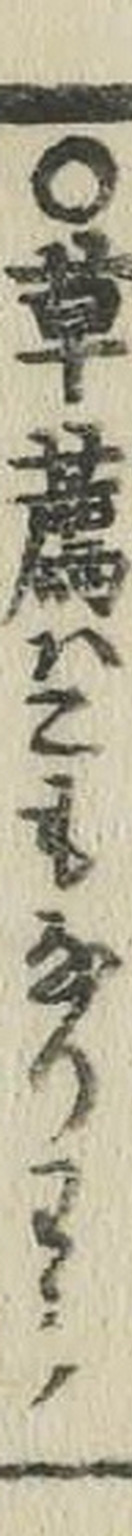○草薦はこもなりわら

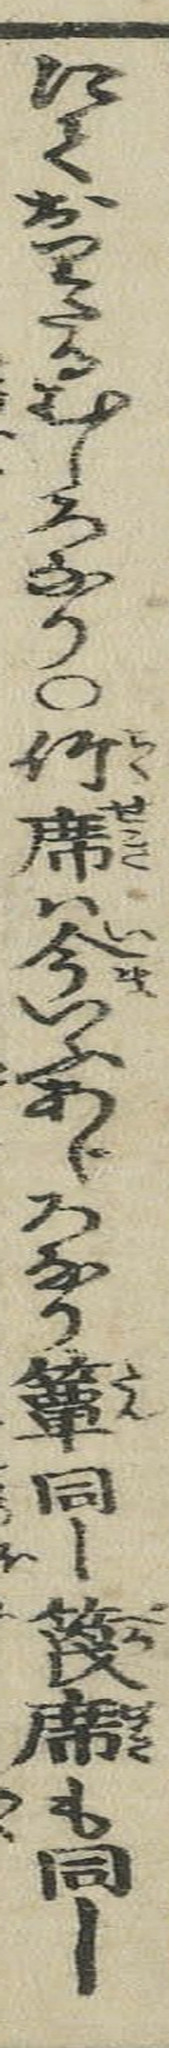にておりたるむしろなり○竹席は今いふあじろなり簟同し篾席も同し
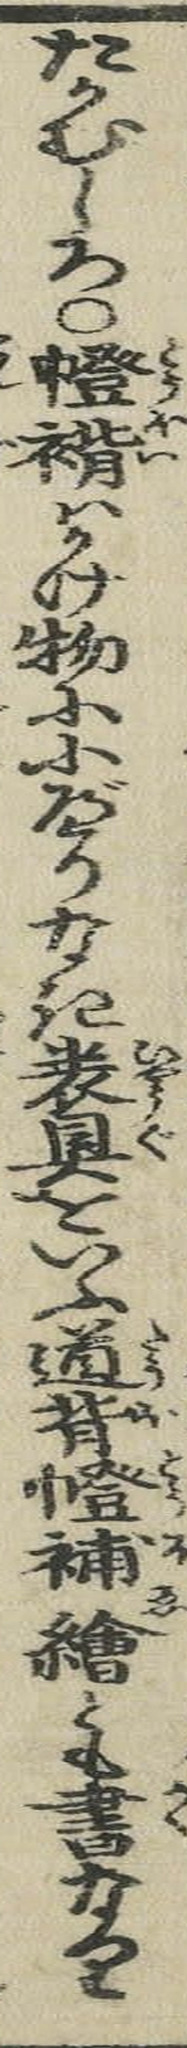たかむしろ○㡠褙はかけ物に小べりなき表具をいふ道背㡠補絵とも書なり
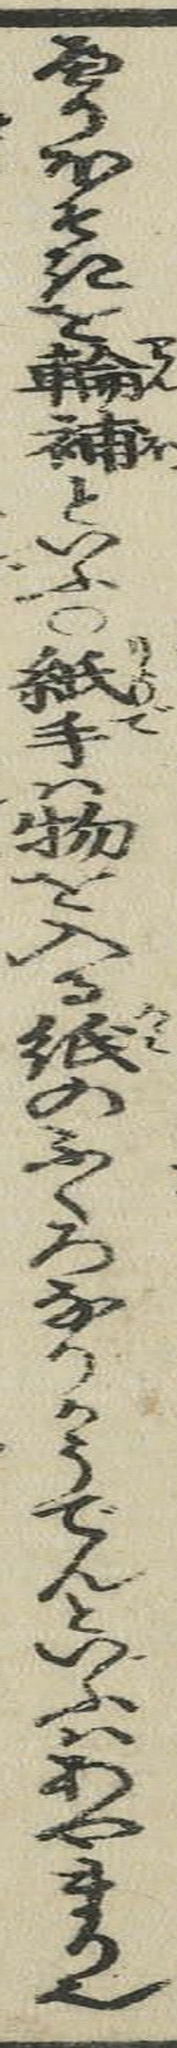へりほそきを輪補といふ○紙手は物を入る紙のふくろなりかうでんといふはあやまり也
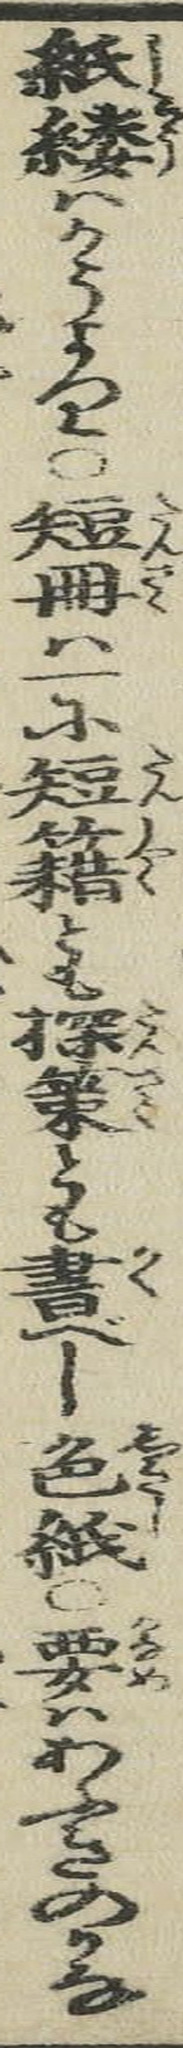紙▢はかうより○短冊は一に短籍とも探索とも書べし色紙○要はあふきのかな
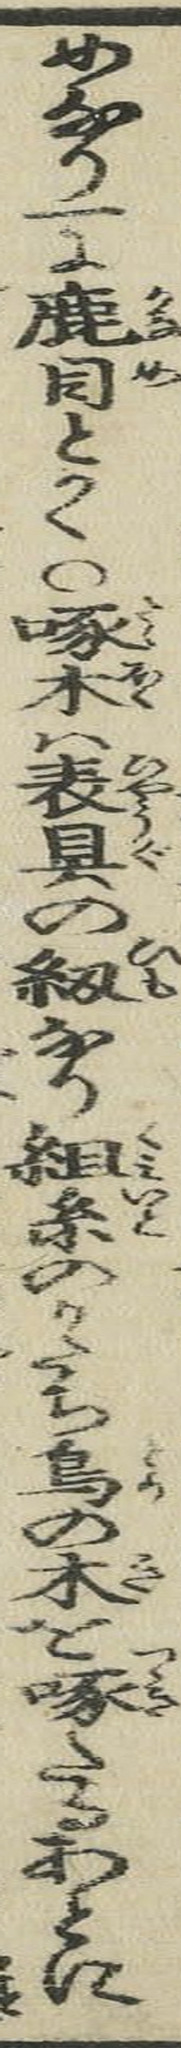めなり一に鹿目とかく○啄木は表具の紐なり組糸のかたち鳥の木を啄たるあとに
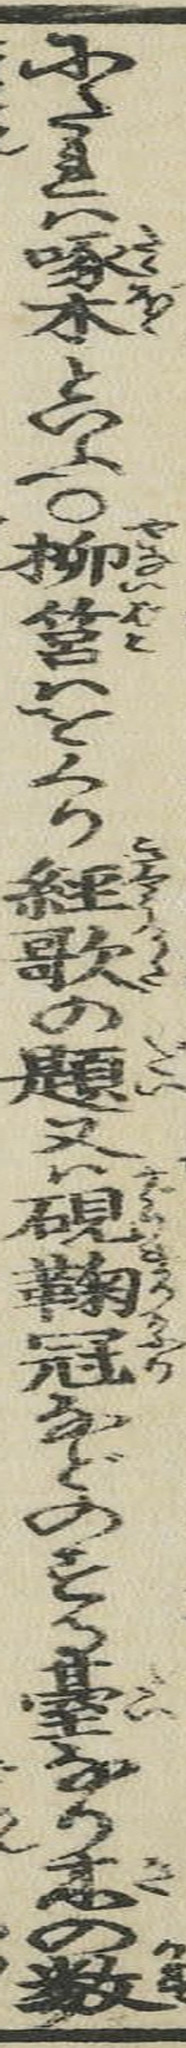にたれは啄木といふ○柳筥はをくり経歌の題又は硯鞠冠などのする台なり木の数
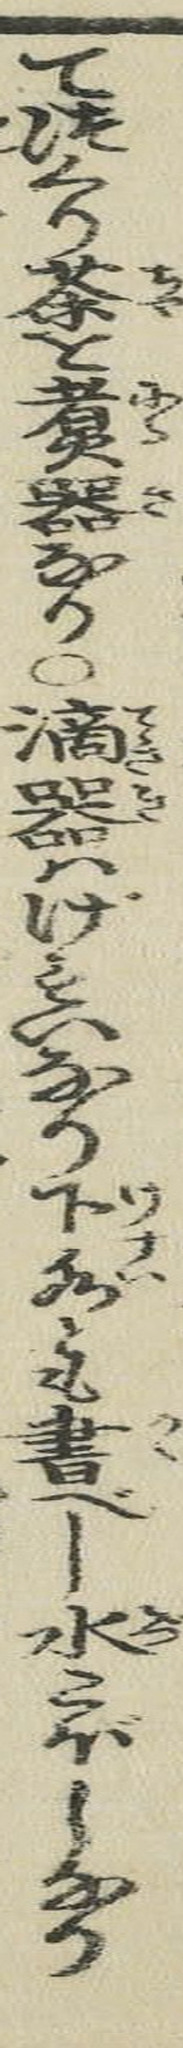てつくり茶を煮器なり○滴器はげすいなり下水とも書べし水こぼしなり
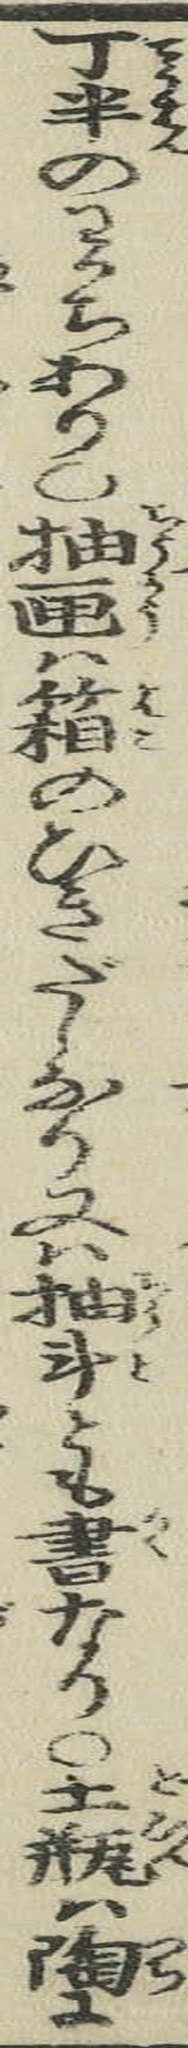丁半のわかちあり○抽匣は箱のひきだしなり又は抽斗とも書なり○土瓶は陶に
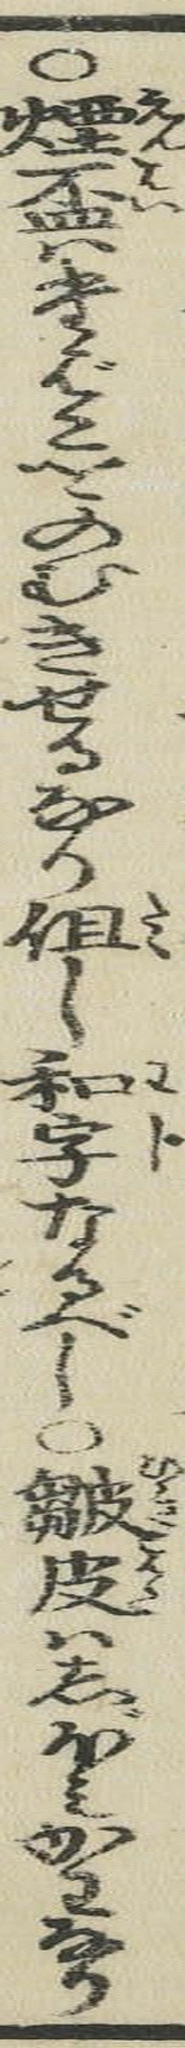○煙盃はたばこをのむきせるなり但し和字なるべし○皺皮はしぼみかわなり
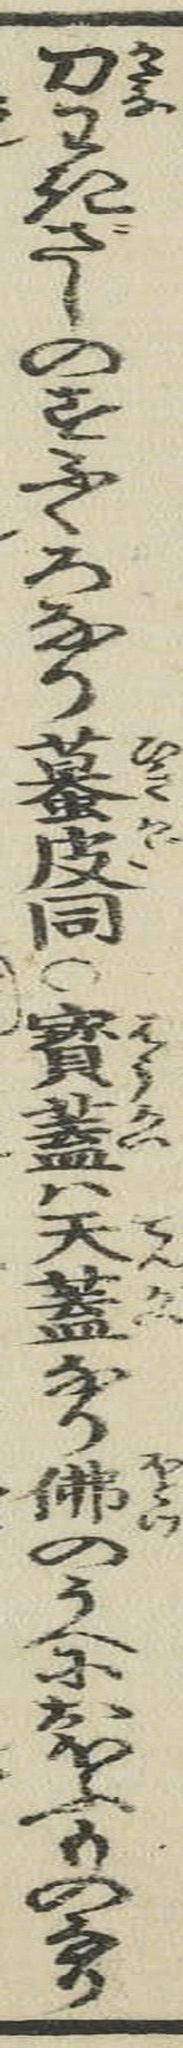刀わきざしのすふくろなり蟇皮同○宝蓋は天蓋なり仏のうへにおほふものなり
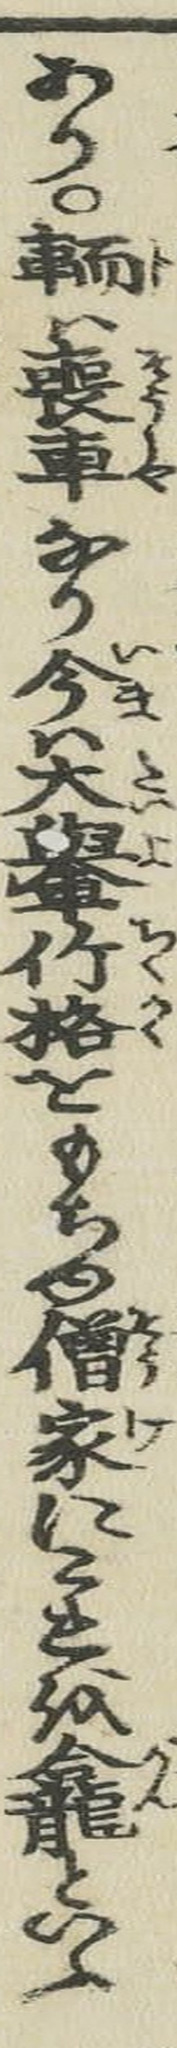あり○輀は喪車なり今は大轝竹格をもちゆ僧家にこれを龕といふ
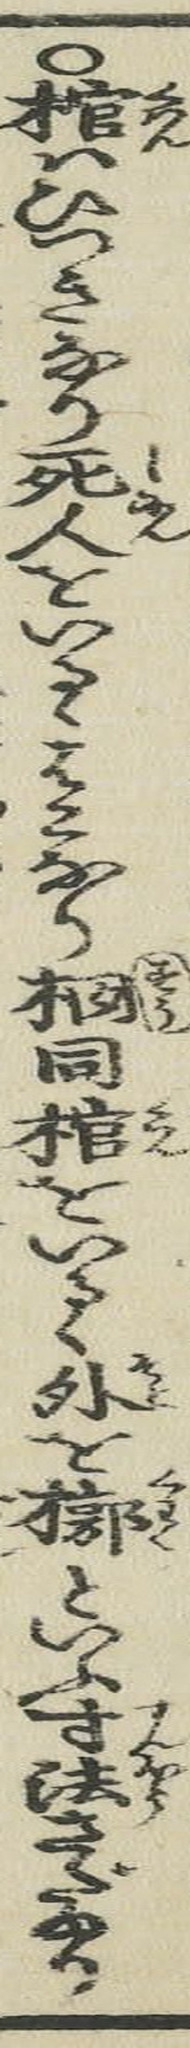○棺はひつきなり死人をいるゝはこなり柩同棺をいるゝ外を槨といふ寸法さだなり
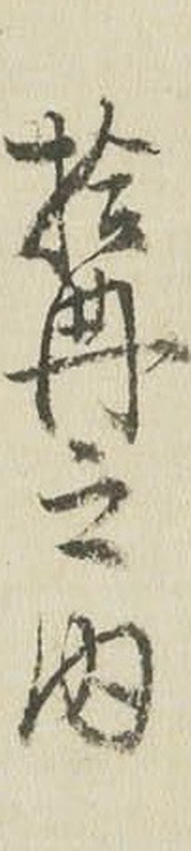拾冊之内
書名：増補頭書訓蒙図彙大成 10巻 5:巻之9-11
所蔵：東京学芸大学教育コンテンツアーカイブ
